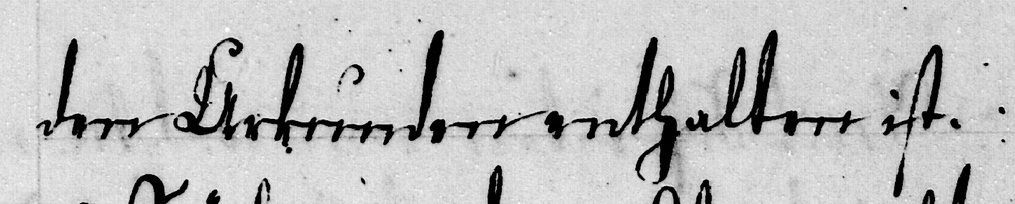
den Urkunden enthalten ist.
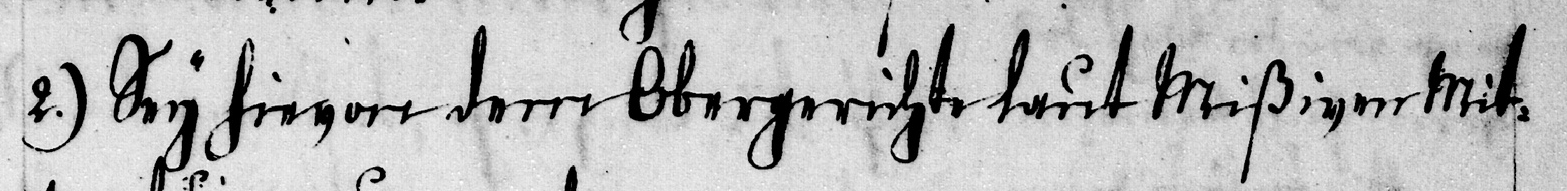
2.) Sey hievon dem Obergerichte laut Mißiven Mit¬
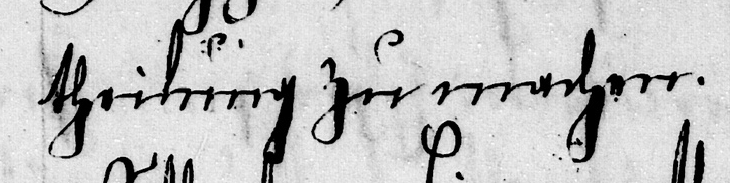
theilung zu machen.
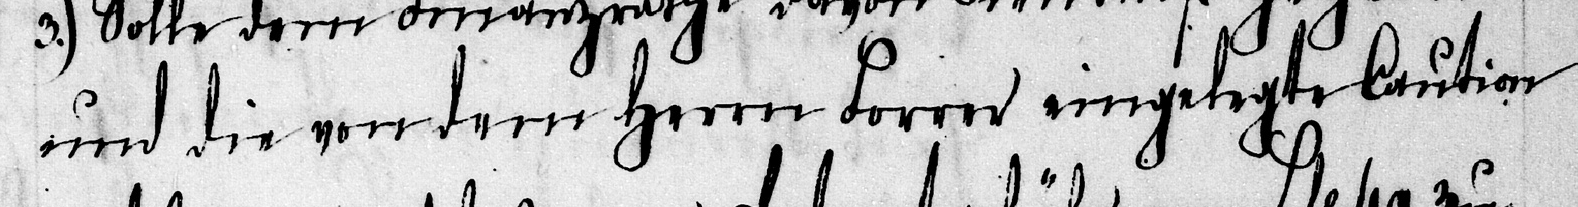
und die von dem Herrn Forrer eingelegte Caution
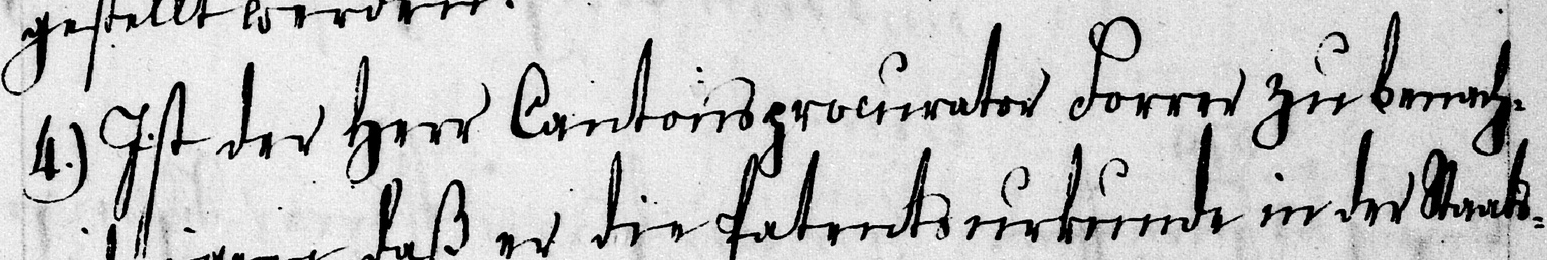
4.) Ist der Herr Cantonsprocurator Forrer zu benach¬
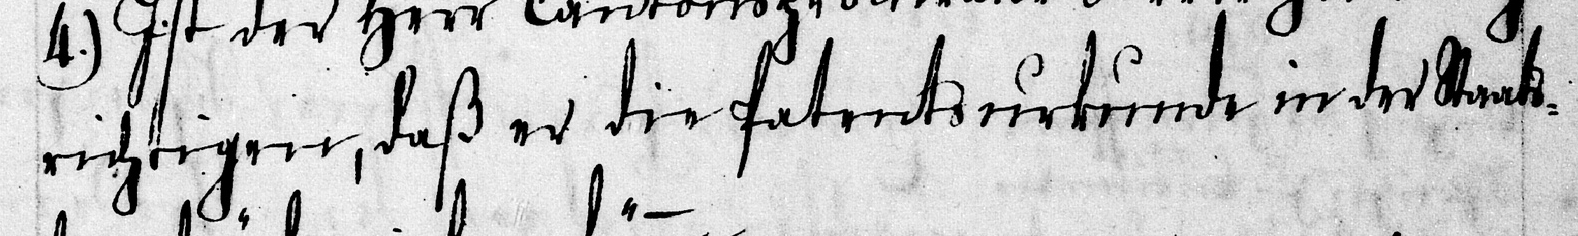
richtigen, daß er die Patentsurkunde in der Staat¬
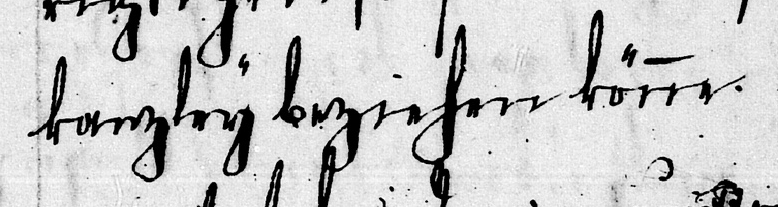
skanzley beziehen könne.
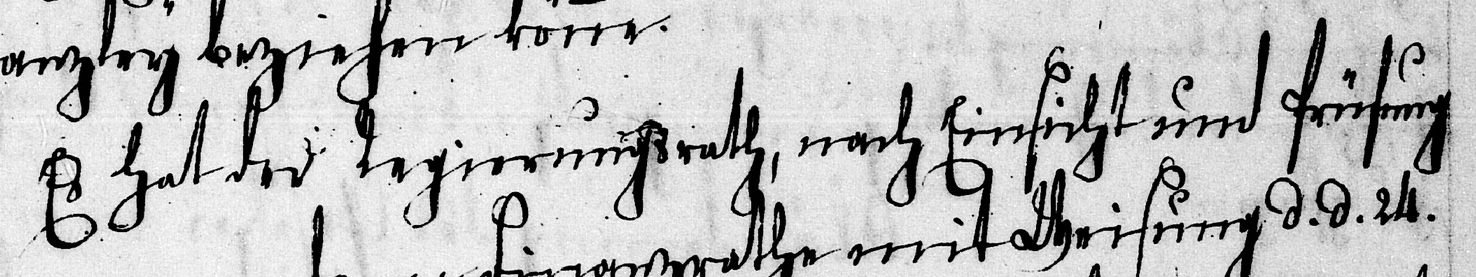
Es hat der Regierungsrath, nach Einsicht und Prüfung
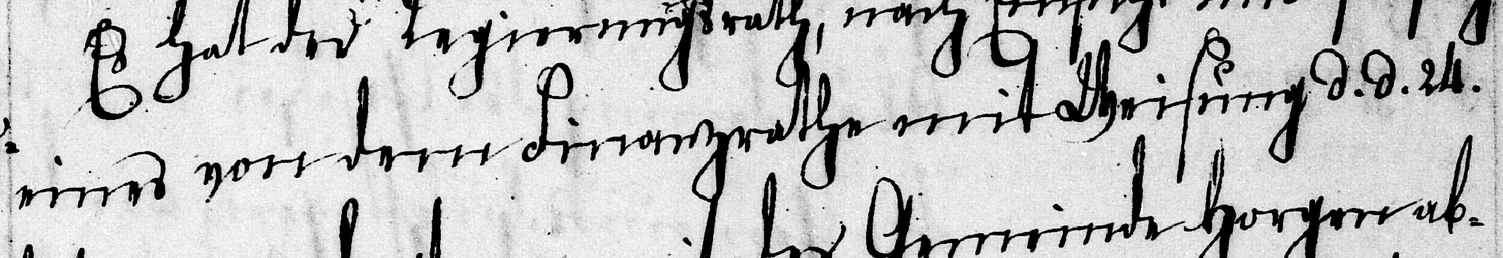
eines von dem Finanzrathe mit Weisung d. d. 24.
